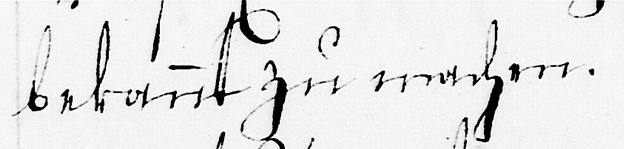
bekannt zu machen.
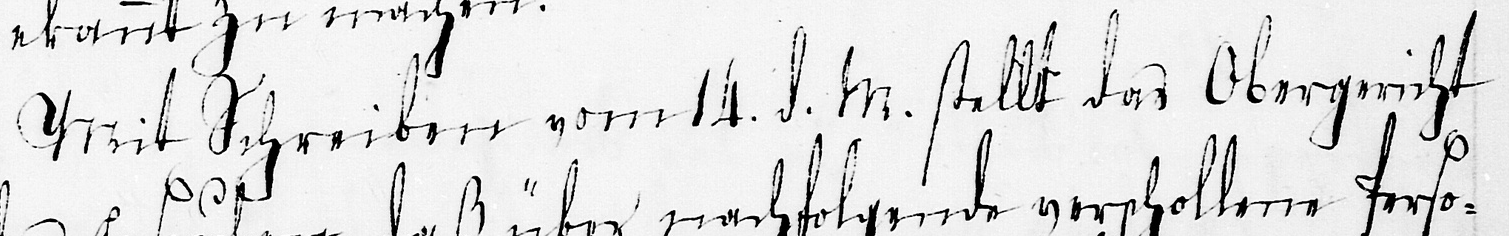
Mit Schreiben vom 14. d. M. stellt das Obergericht
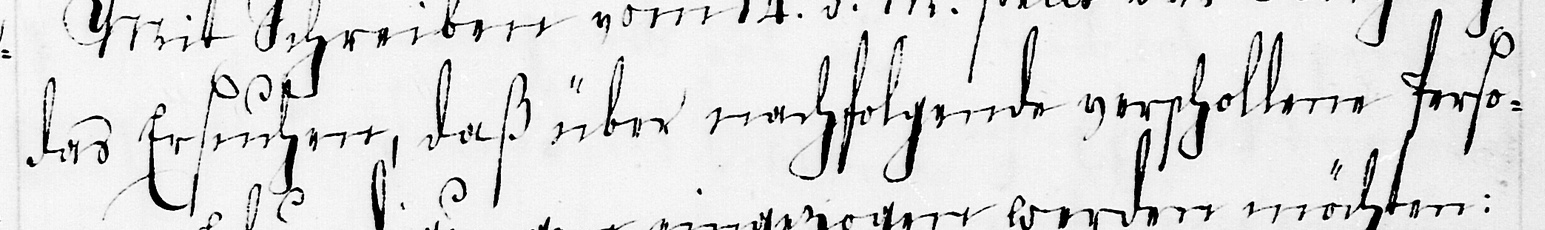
das Ersuchen, daß über nachfolgende verschollene Perso¬
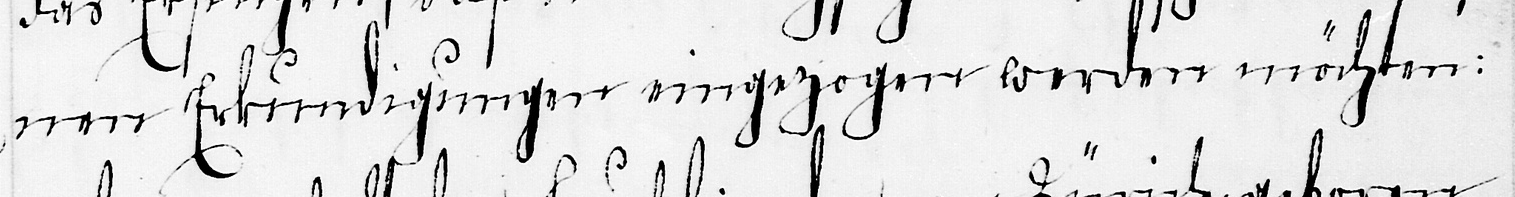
nen Erkundigungen eingezogen werden möchten:
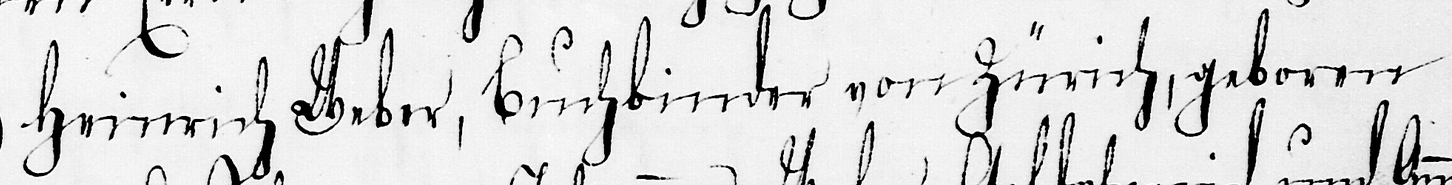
Heinrich Weber, Buchbinder von Zürich, geboren
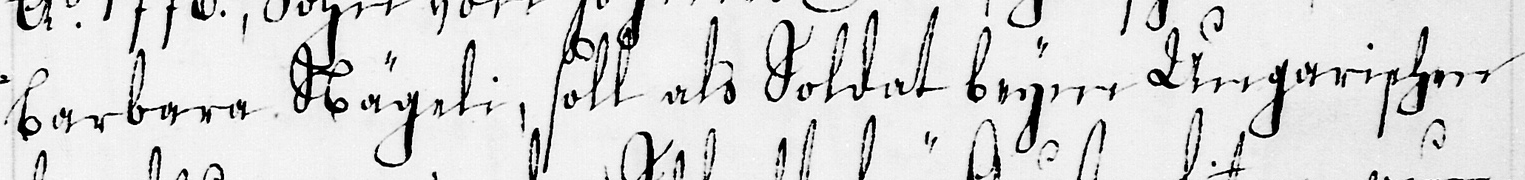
Barbara Nägeli, soll als Soldat beym Ungarischen
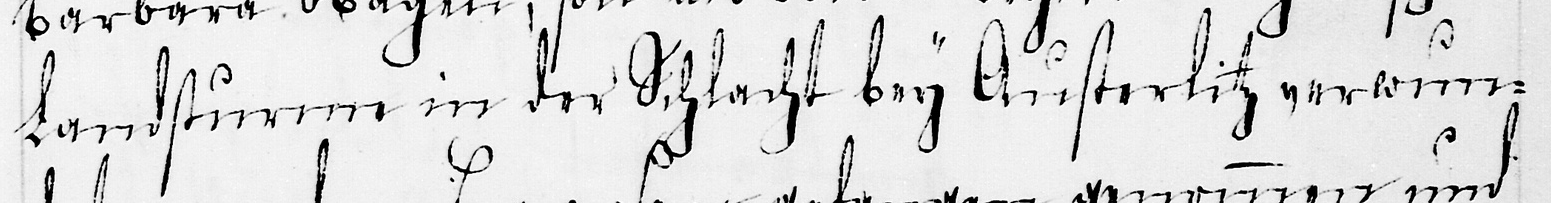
Landsturme in der Schlacht bey Austerlitz verwun¬
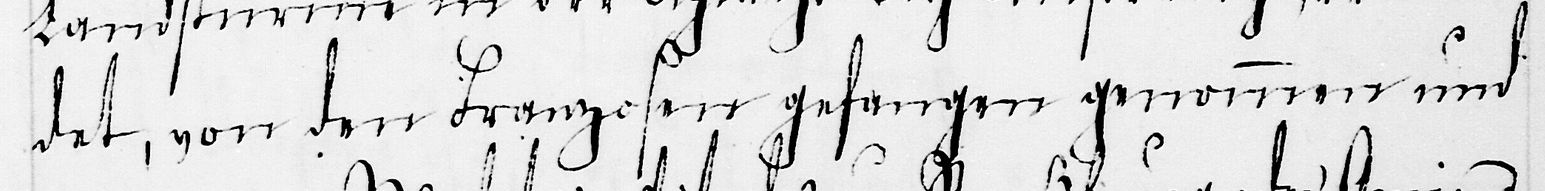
det, von den Franzosen gefangen genommen und
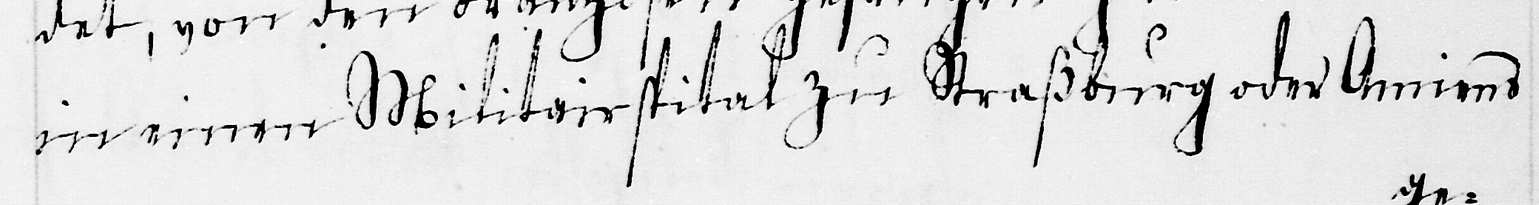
in einen Militairspital zu Straßburg oder Amiens
